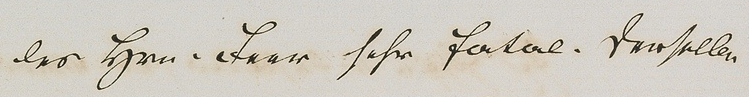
des Hrn. Feer sehr fatal. Derselbe
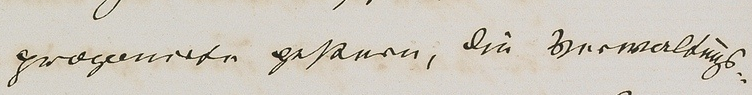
proponirte gestern, die verwaltungs-
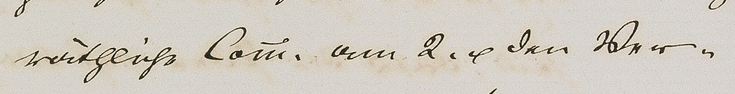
räthliche Comm. am 2. & den Ver-
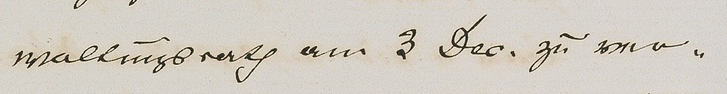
waltungsrath am 3 Dec. zu ver-
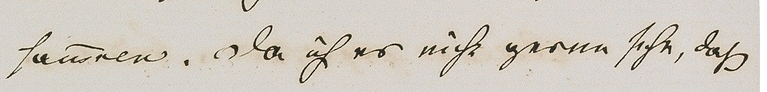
sammeln. Da ich es nicht gerne sehe, daß
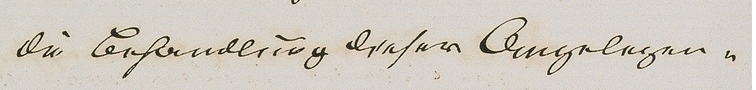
die Behandlung dieser Angelegen-
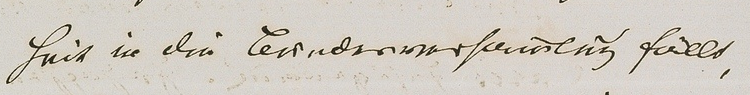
heit in die Bundesversammlung fällt,
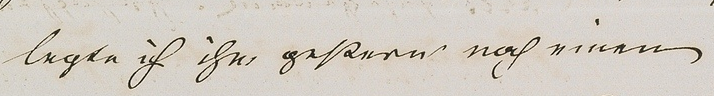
legte ich ihm gestern noch einen
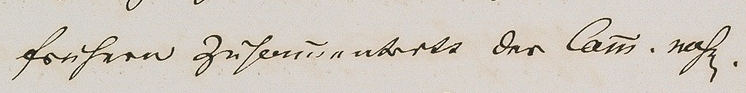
frühern Zusammentritt der Comm. nahe.
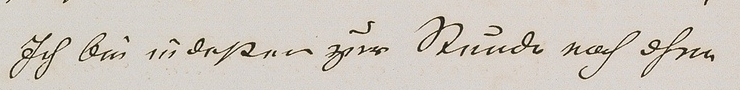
Ich bin indeßen zur Stunde noch ohne
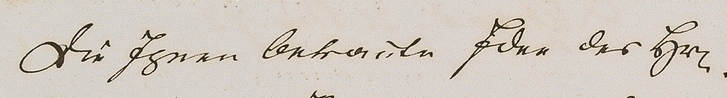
Die Ihnen bekannte Idee des Hrn.
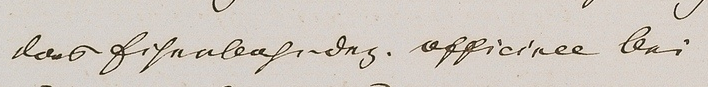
das Eisenbahndep. officiell bei
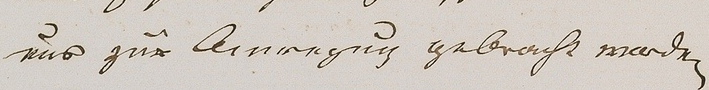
uns zur Anregug gebracht worden.
